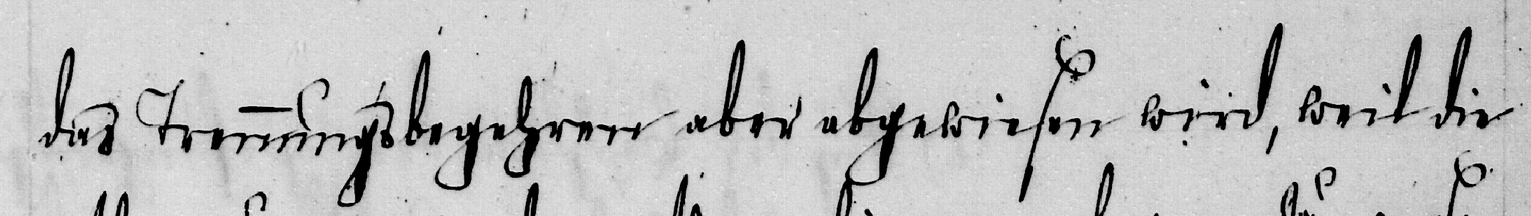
das Trennungsbegehren aber abgewiesen wird, weil die
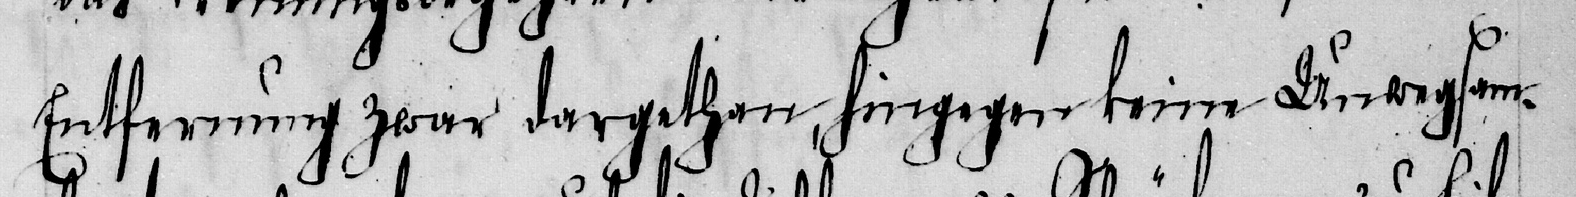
Entfernung zwar dargethan, hingegen keine Unwegsam¬
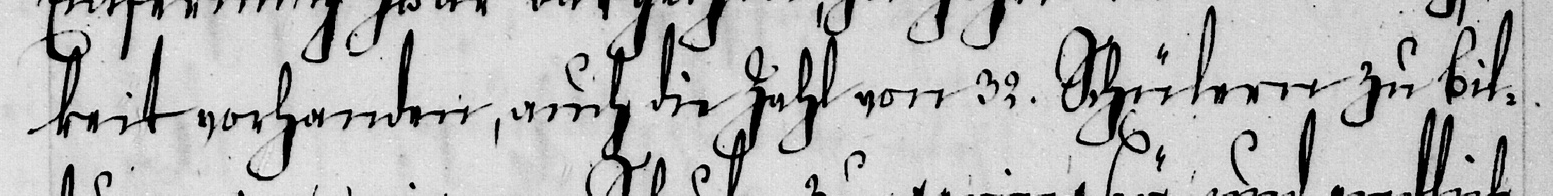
keit vorhanden, auch die Zahl von 32. Schülern zu Bil¬
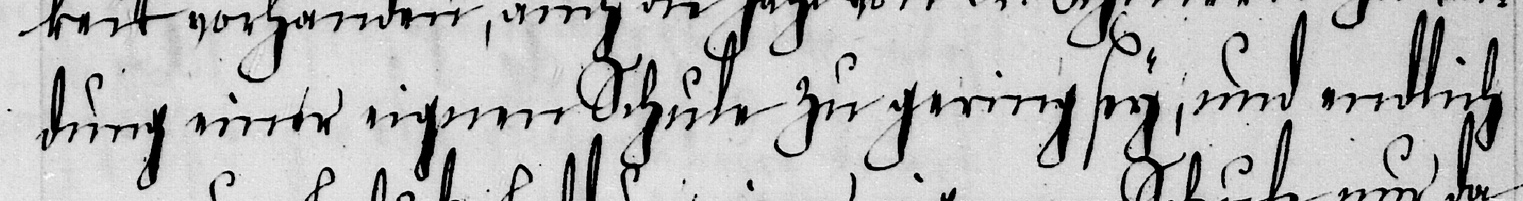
dung einer eigenen Schule zu gering sey, und endlich
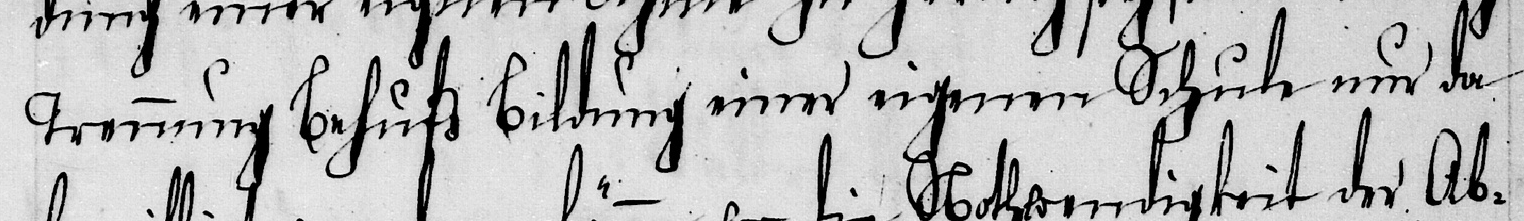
Trennung Behufs Bildung einer eigenen Schule nur da
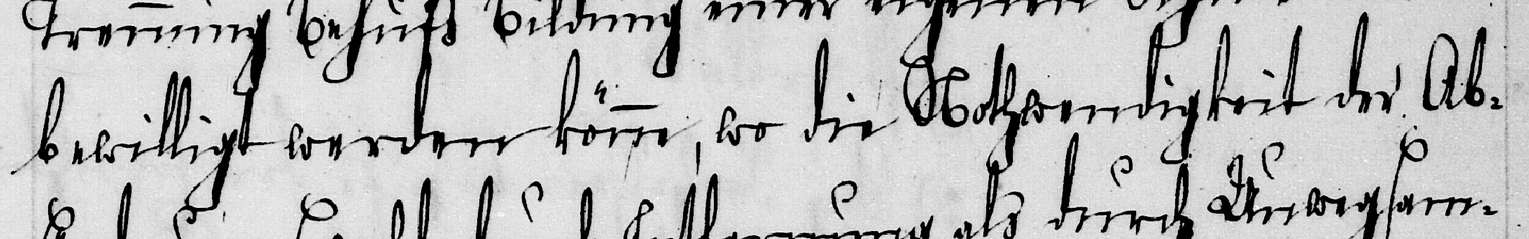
bewilligt werden könne, wo die Nothwendigkeit der Ab¬
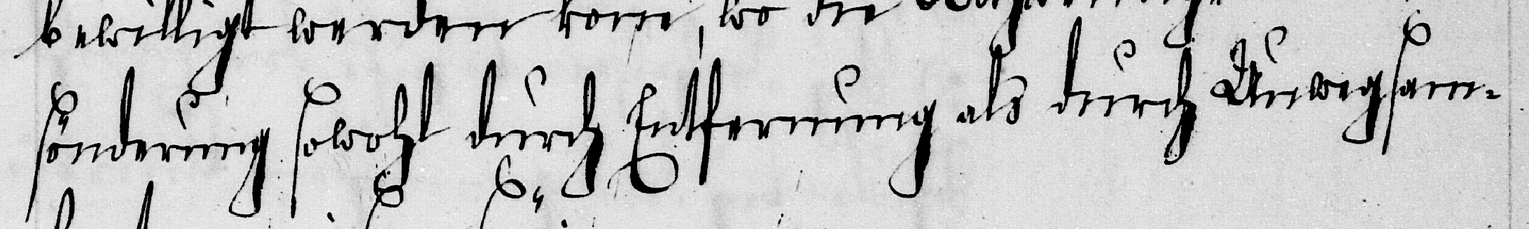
sönderung sowohl durch Entfernung als durch Unwegsam¬
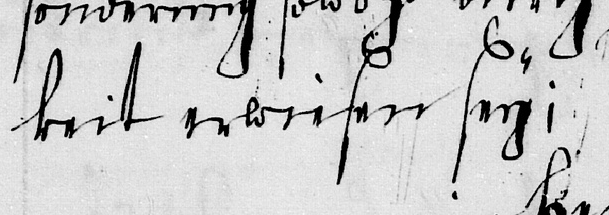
keit erwiesen sey;
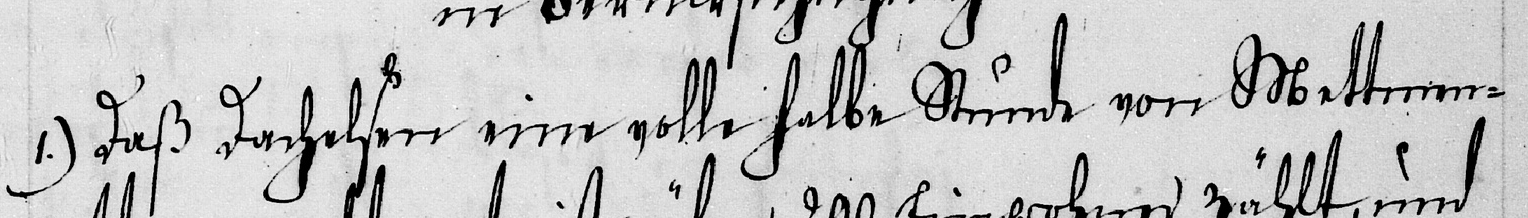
1.) Daß Dachelsen eine volle halbe Stunde von Mettmen¬
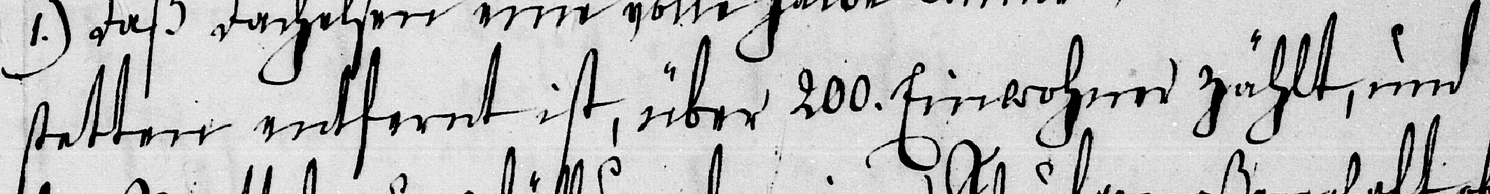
stetten entfernt ist, über 200. Einwohner zählt, und
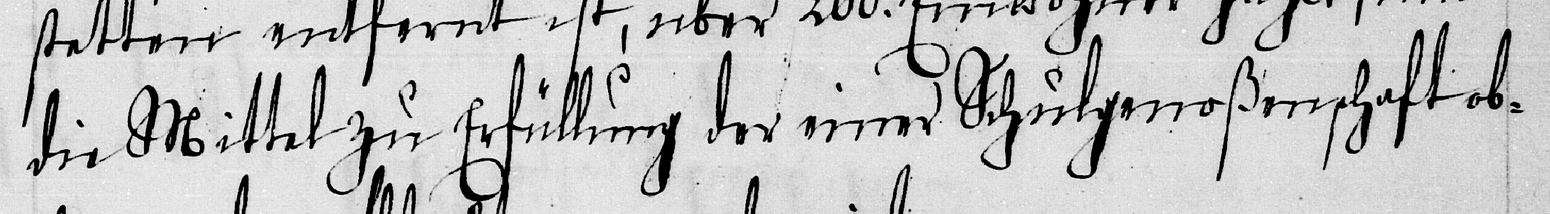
die Mittel zu Erfüllung der einer Schulgenoßenschaft ob¬
